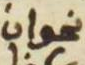نحو ان
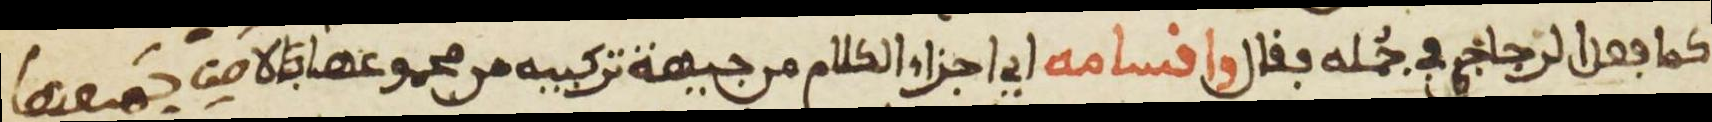كما فعل الزجاجي في جملة فقال و اقسامه اي اجزاء الكلام من جيهة تركيبه من مجموعها لا
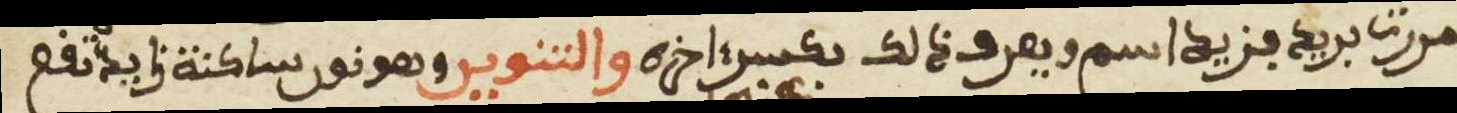مررت بريد فزيد اسم و يعرف ذلك بكسر آخره و التنوير و هو نور ساكنة زايد تقع
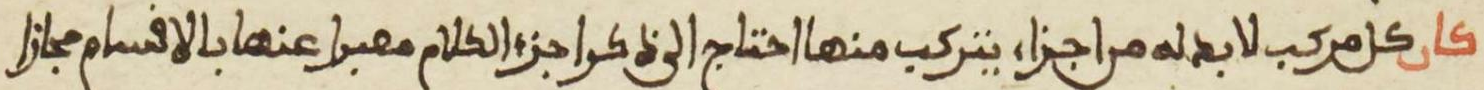كان كل مركب لابد له من اجزاء يتركب منها احتاج الى ذكر اجزء الكلام معبرا عنها مجازا
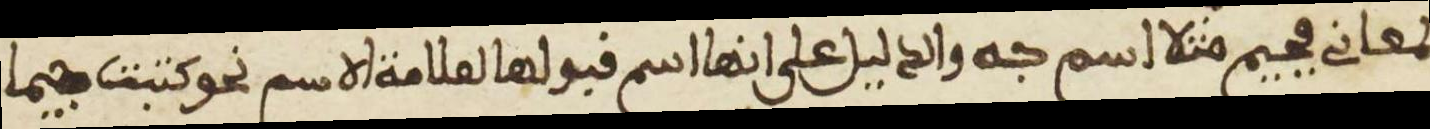لمعانى فجيم مثلا اسم جه والدليل على انها اسم قبولها لعلامة الاسم نحو كتبت جيما
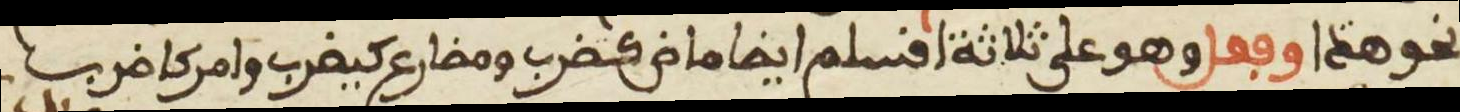نحو هذا و فعل و هو على ثلاثة اقسام ايضا ماض كضرب و مضارع كيضرب و امر كاضرب
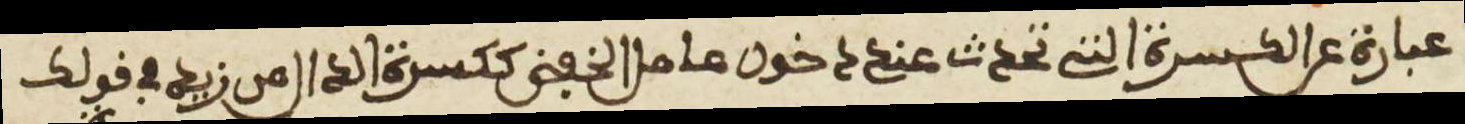عبارة عن الكسرة التي تحدث عند دخول عامل الخفض ككسرة الدال من زيد في قولك
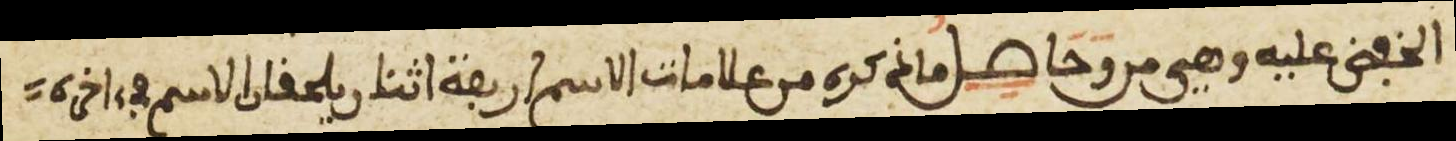الخفض عليه و هي من و حاصل ما ذكره من علامات الاسم اربعة اثنان يلحقان الاسم في آخره
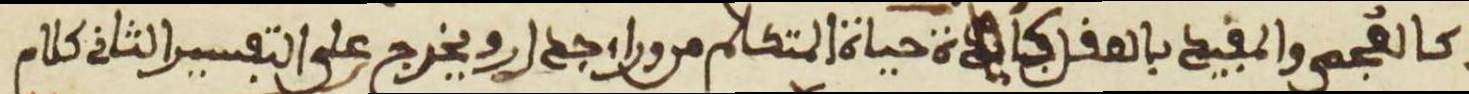كالعجمي و المفيد بالفعل كافدة حياة المتكلم من ورتء جدار و يخرج على التفسير الثاني كلام
